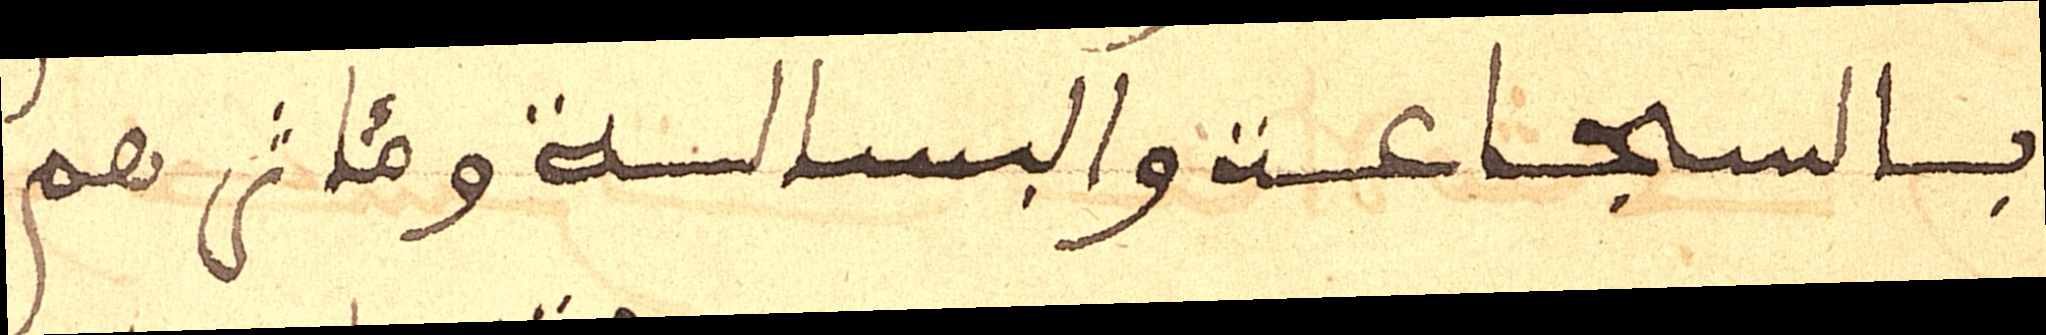بالسجاعة والبسالة ومئاثرهم
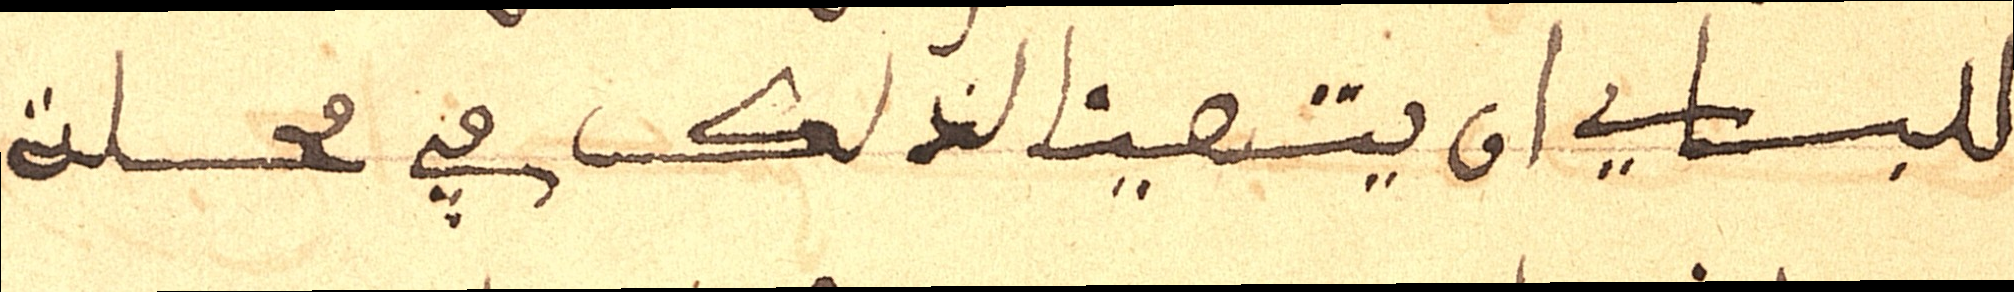للباي ان يتقيا لذلك في محلة
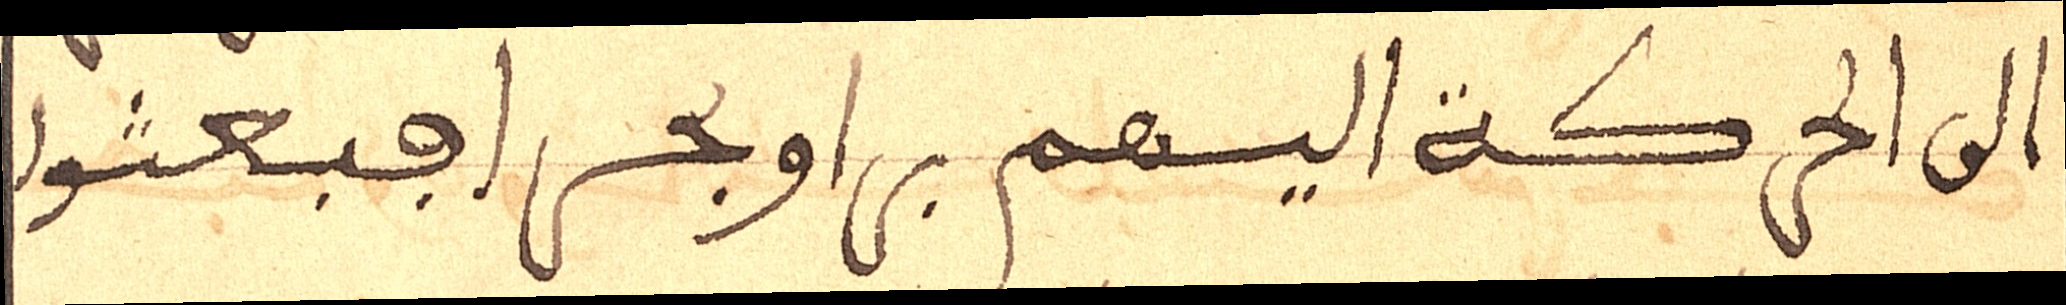الى الحركة اليهم براو بحرافبعثوا
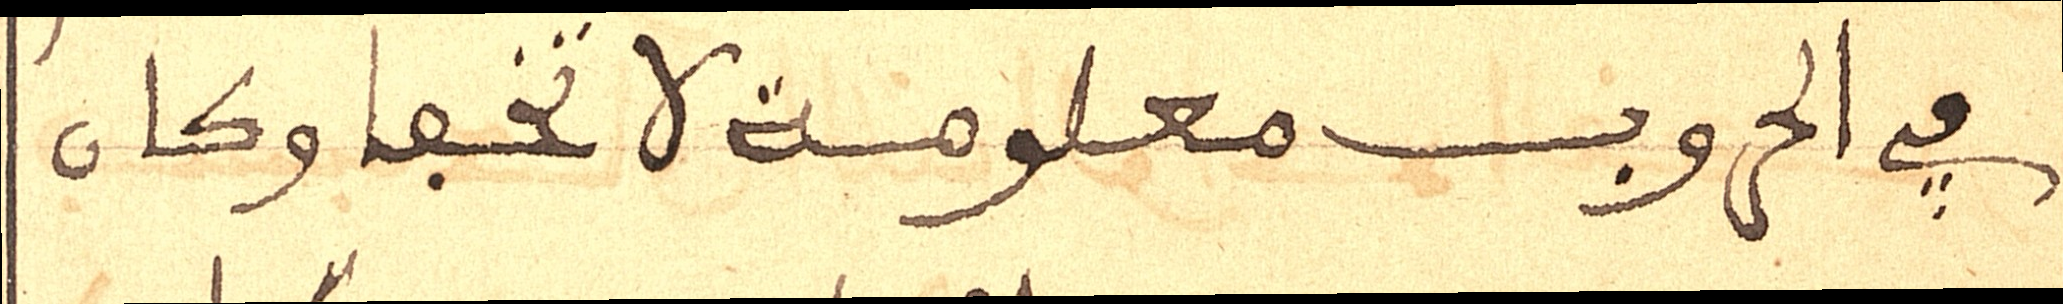في الحروب معلومة لا تخفا وكان
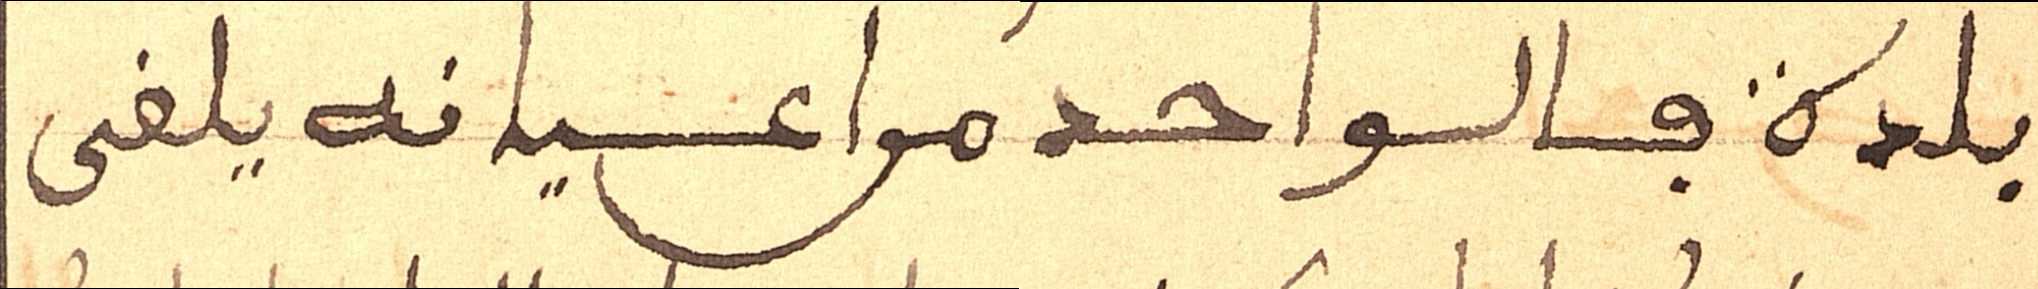بلدة فالواحد من اعيانه يلقى
